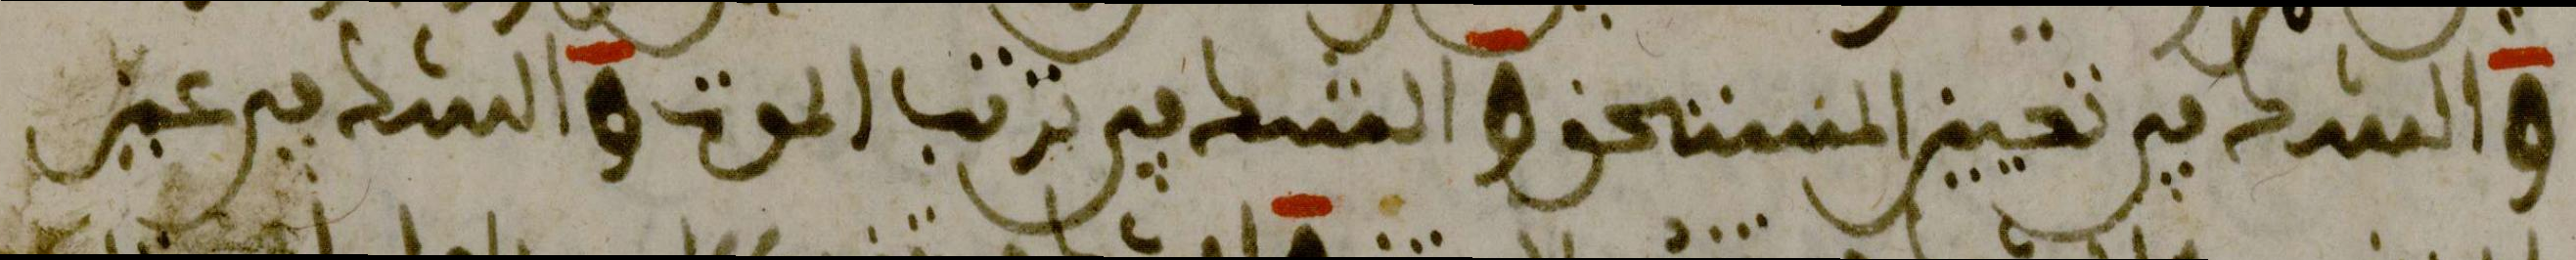والشد في تعيين المستحق والشد في ترتب الموت والشد في غير
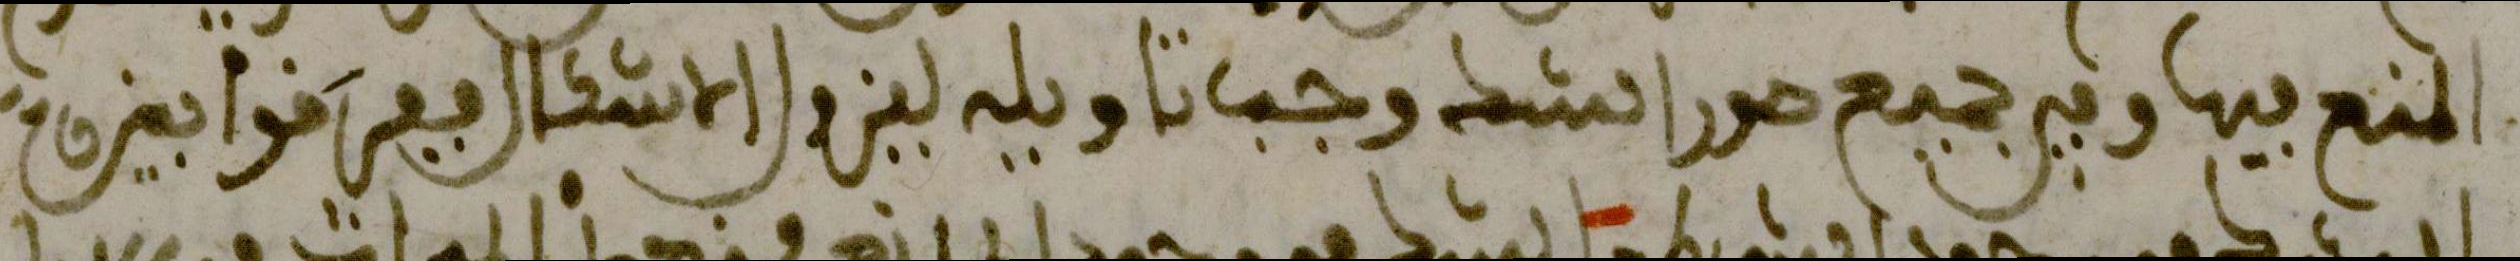المنع فيها وفي جميع صور الشد وجب تاويله ليزول الاشكال ففر قوا بين
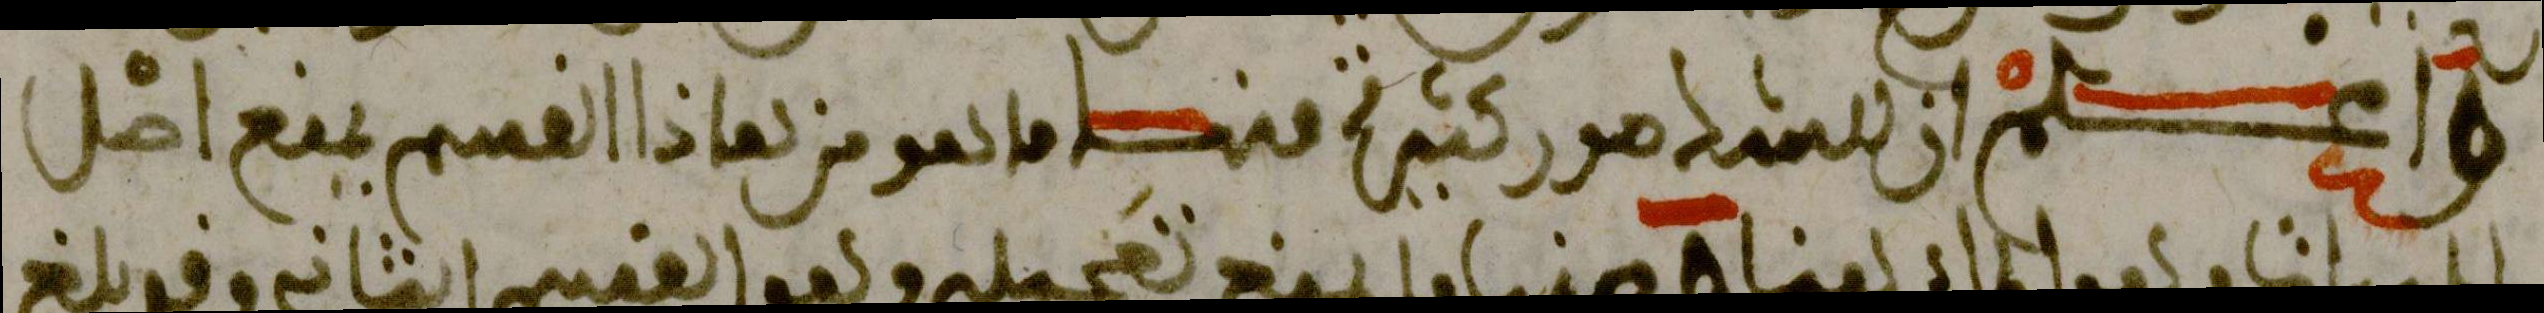واعلم ان للشد صور كثيرة منها ما هو من هاذا القسم يمنع اصل
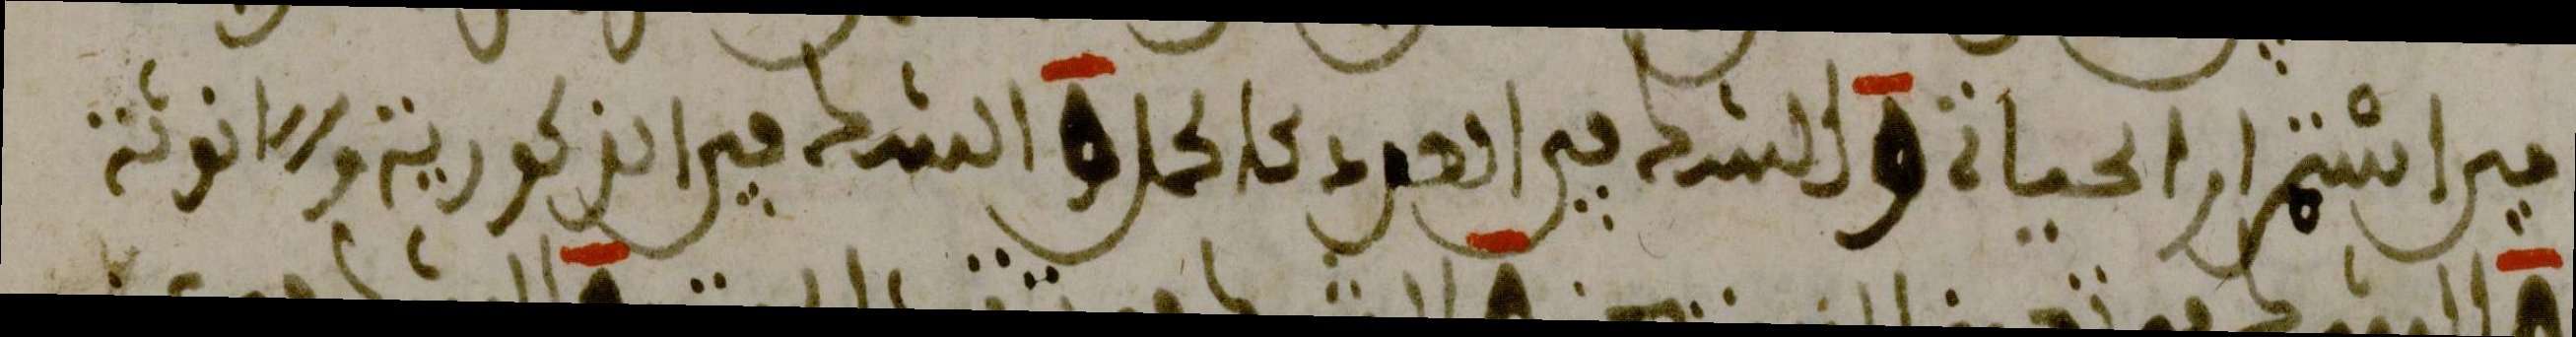في استمرار الحياة والشد في العدد كالحمل والشد في الذكورية والانوثة
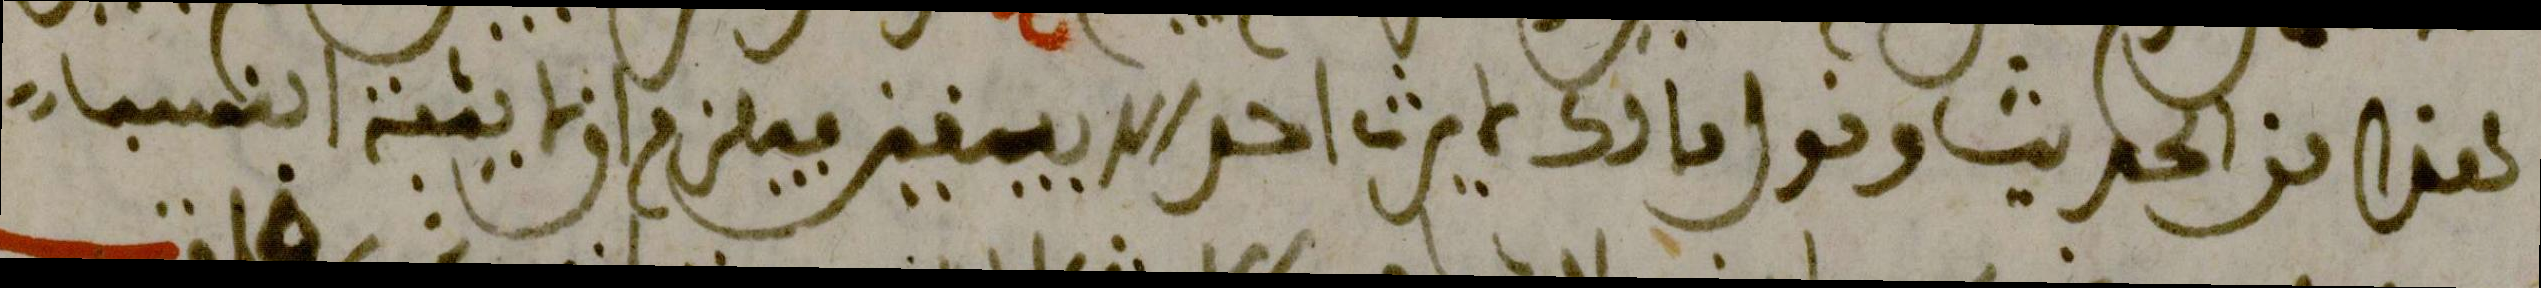هذا من الحديث وقول مالك لا يرث احد الا بيقين فيلزم ان لا يثبة النسب
